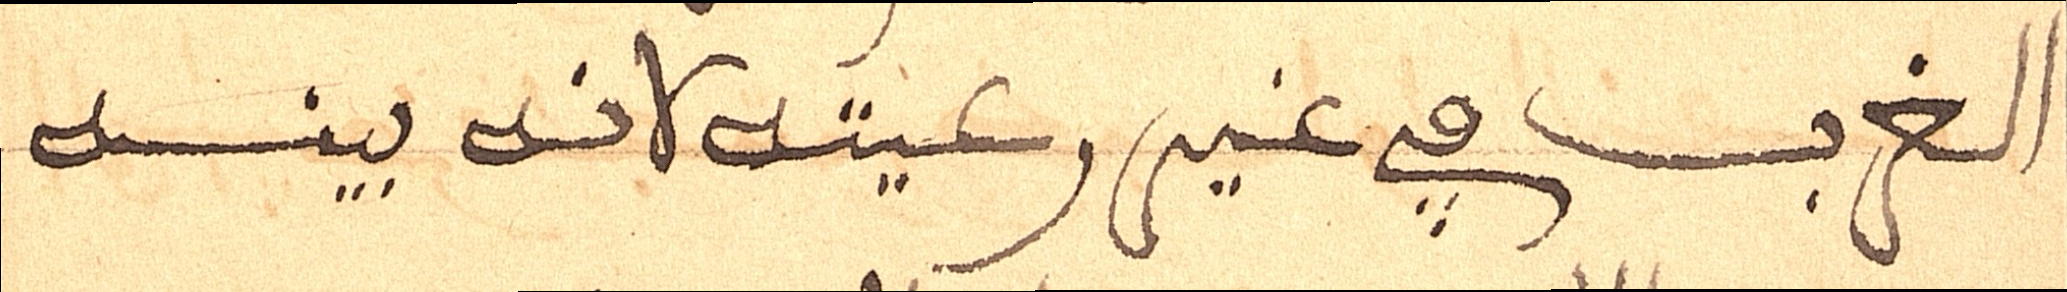الغرب في غير رعيته لانه بينه
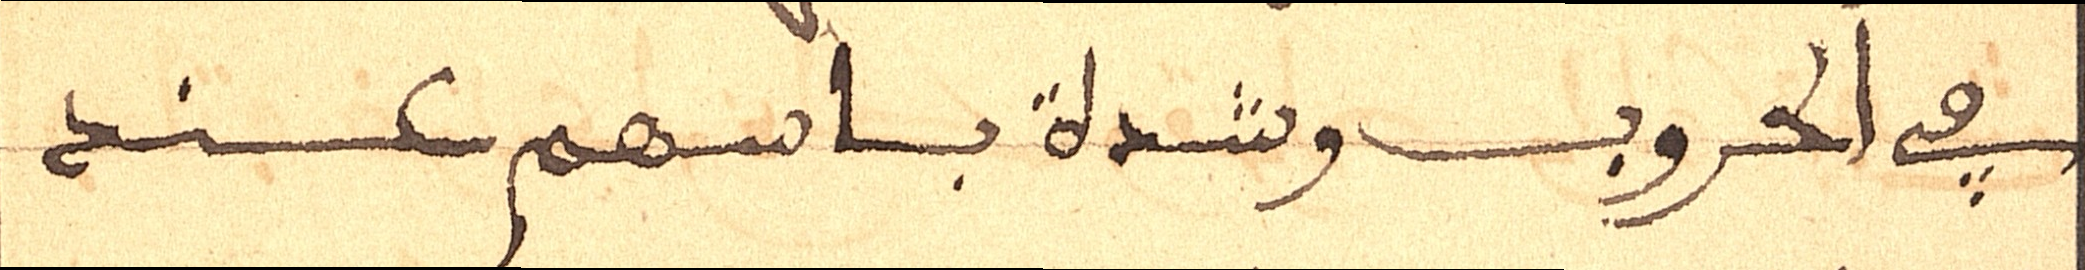في الحروب وشدة باسهم عند
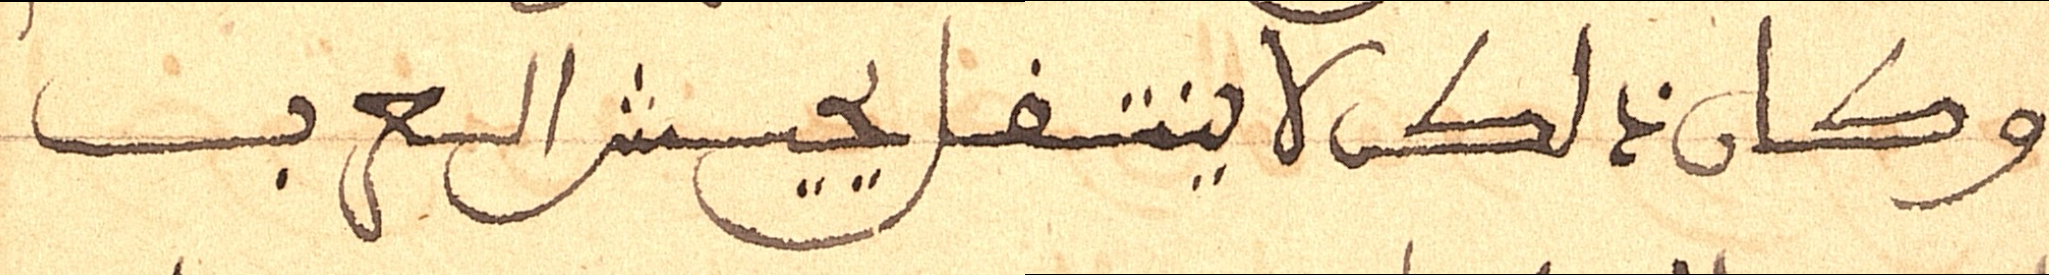وكان ذلك لاينتقل يحيش العرب
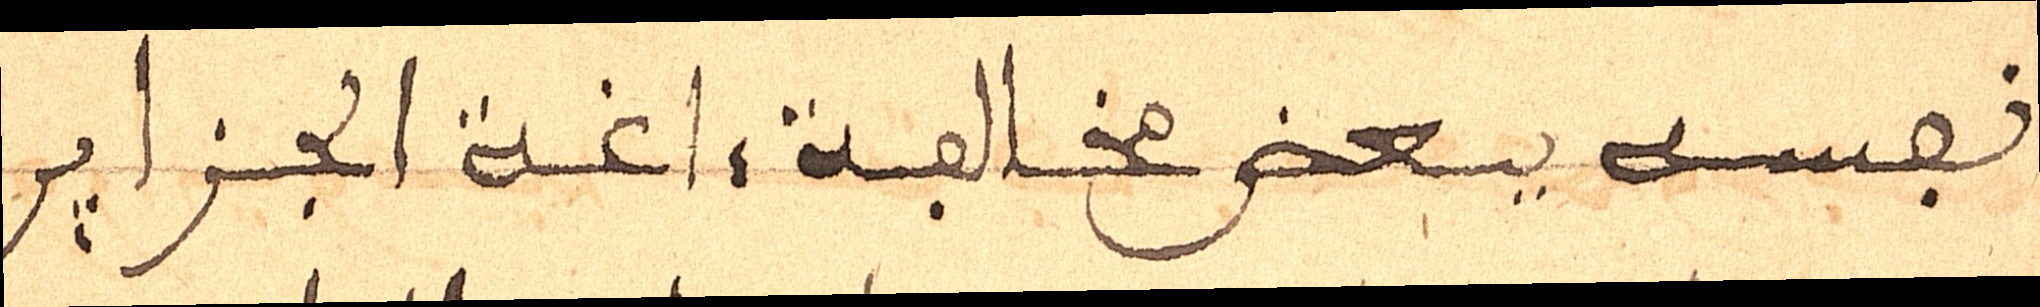نفسه ببعض مخالفة ءاغة الجزائر
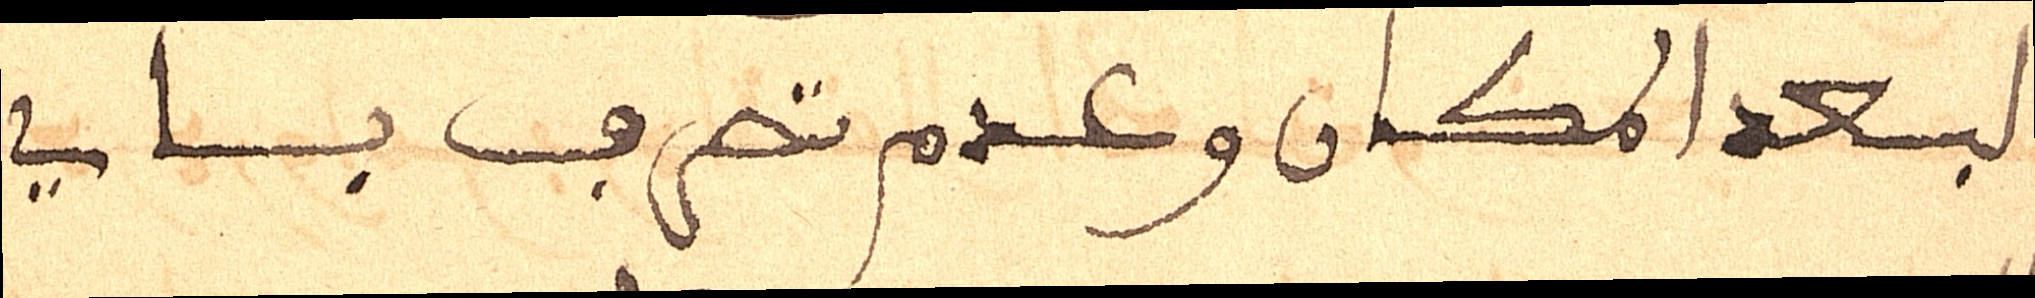لبعد المكان وعدم تصرف باي
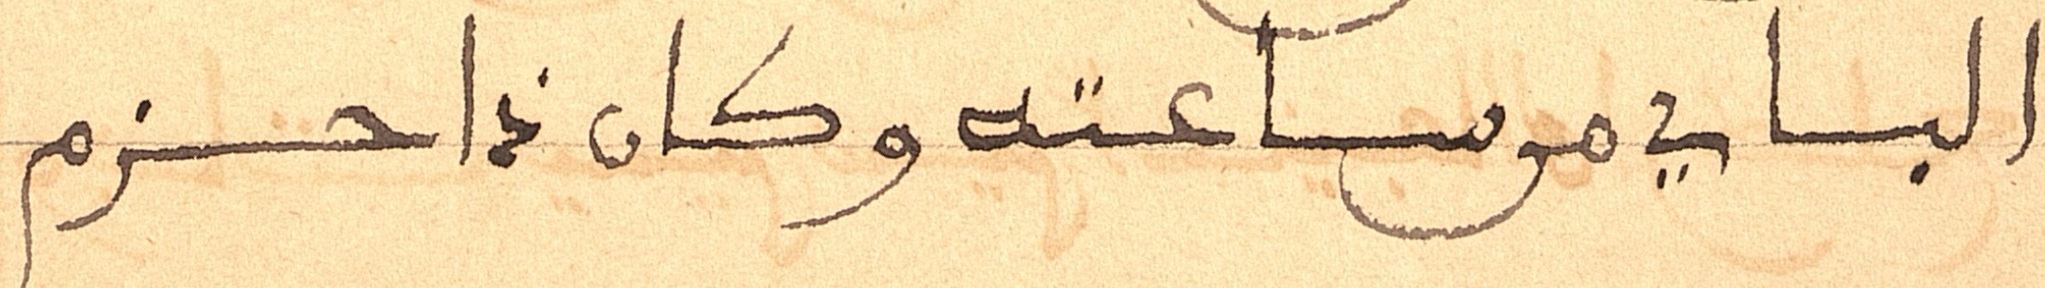الباي من ساعته وكان ذاحزم
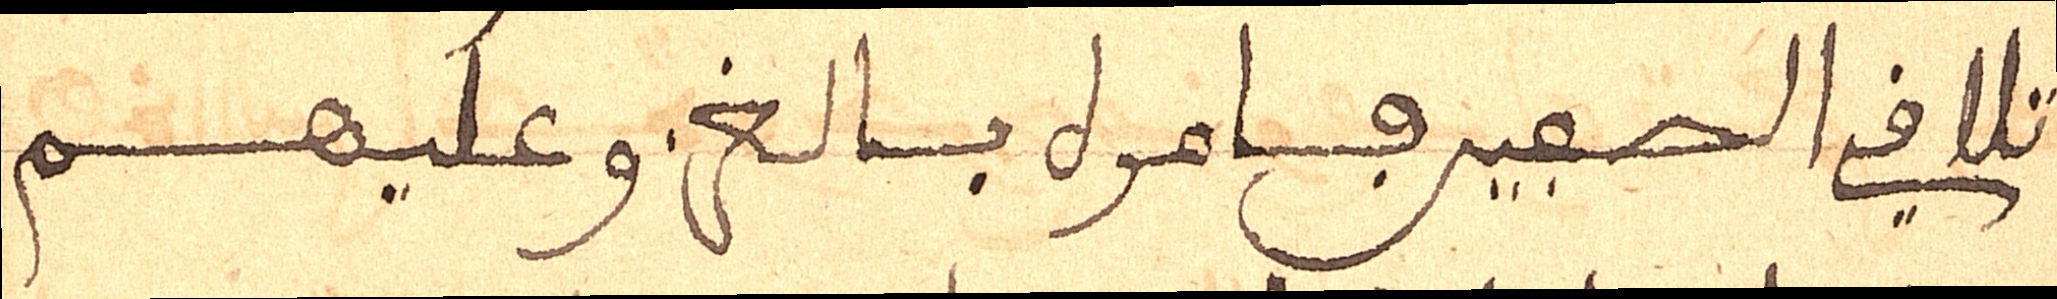تلاقي الصفين فامره بالغز وعليهم
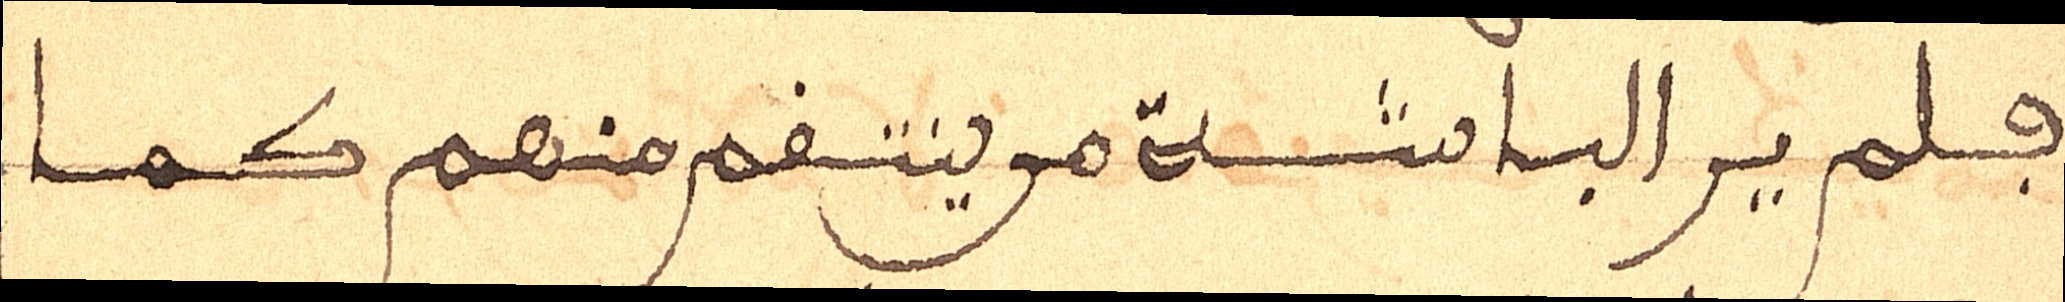فلم ير الباشة من ينتقم منهم كما
